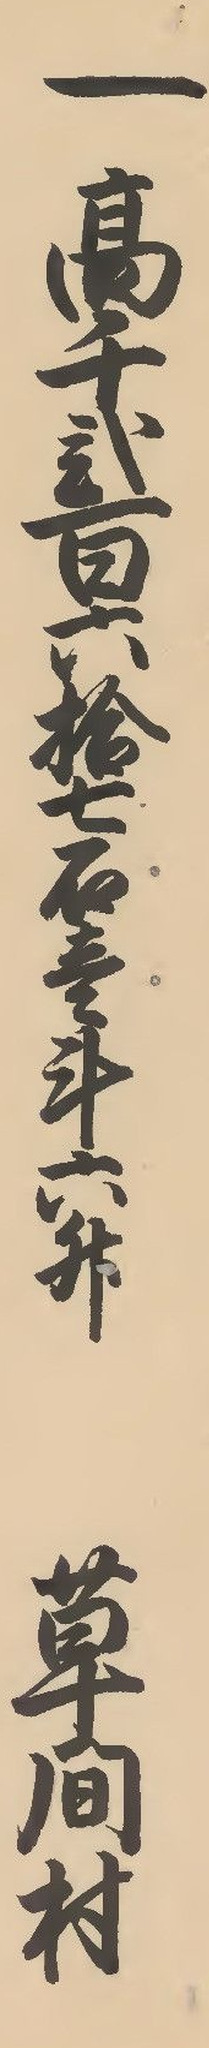一高千弐百六拾七石壱斗六升草間村
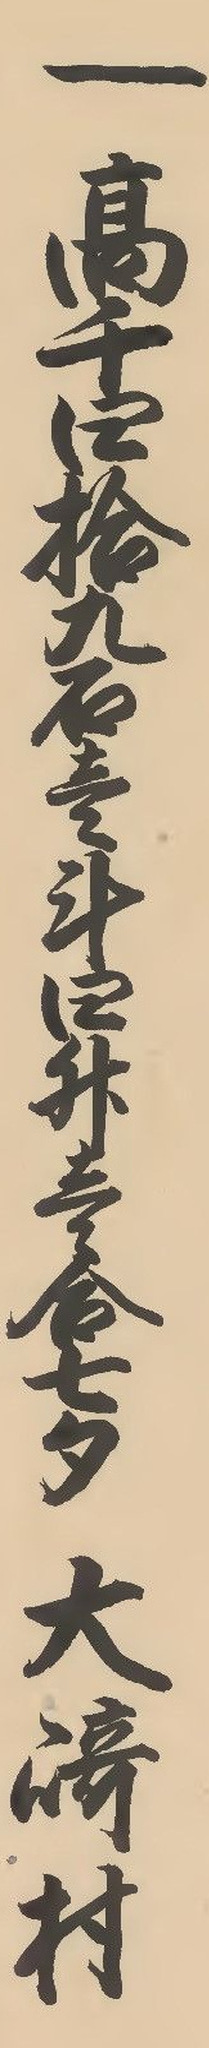一高千四拾九石壱斗四升壱合七勺大崎村
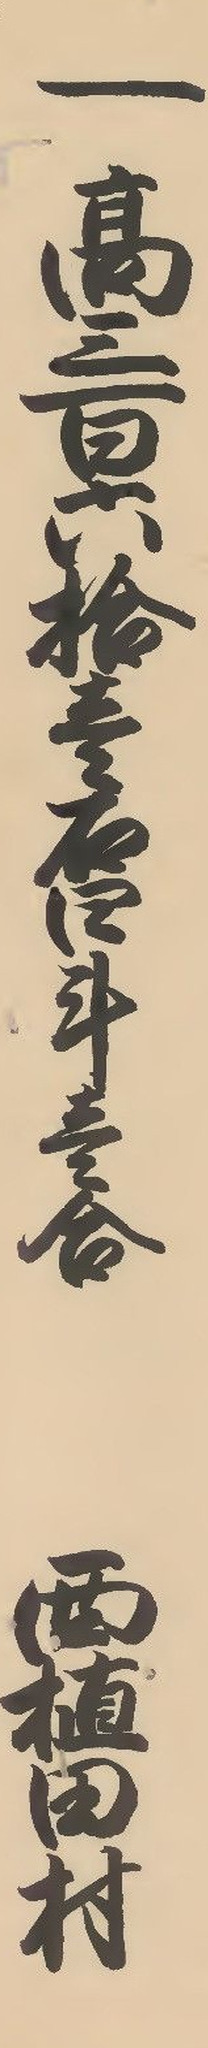一高三百六拾壱石四斗壱合西植田村
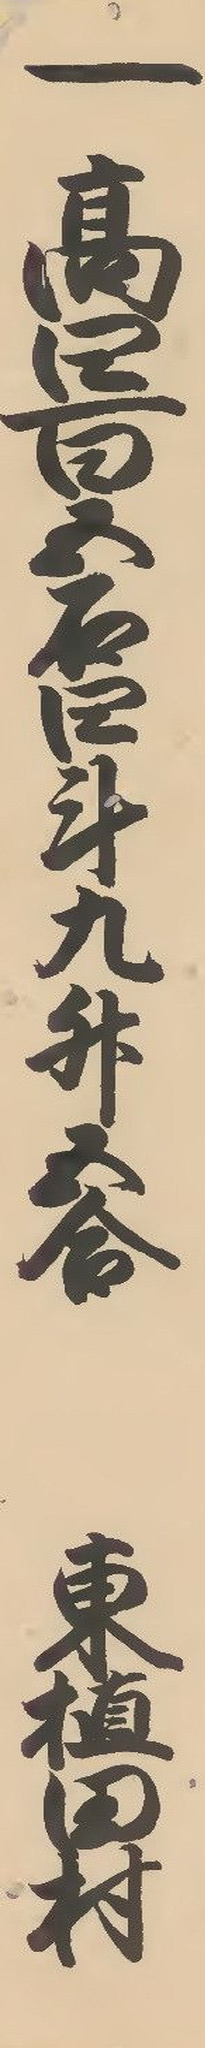一高四百五石四斗九升五合東植田村
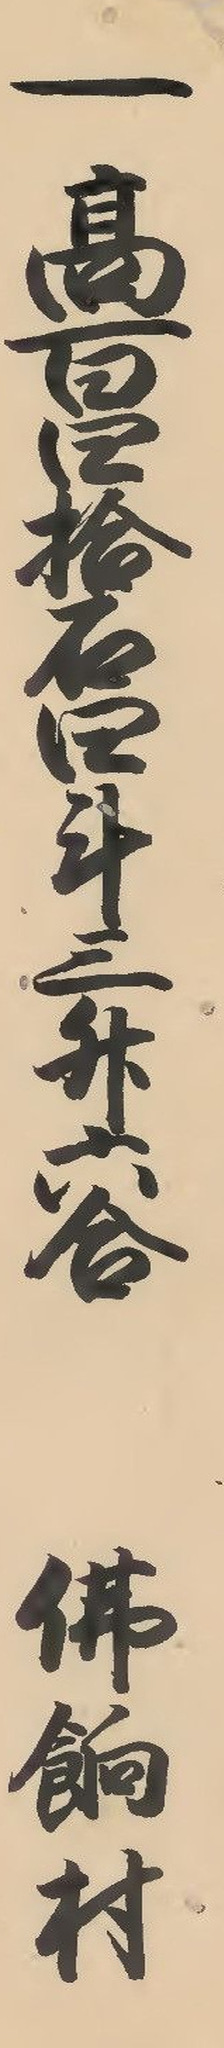一高百四拾石四斗三升六合仏餉村
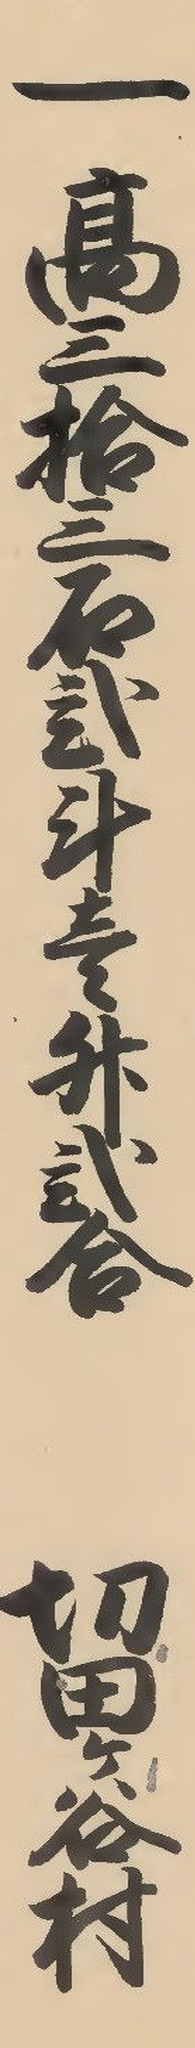一高三拾三石弐斗壱升弐合切田ヶ谷村
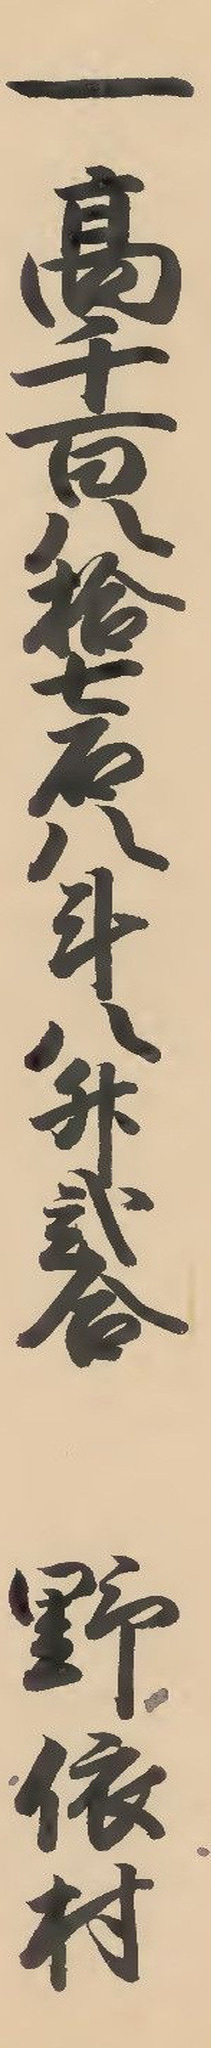一高千百八拾七石八斗八升弐合野依村

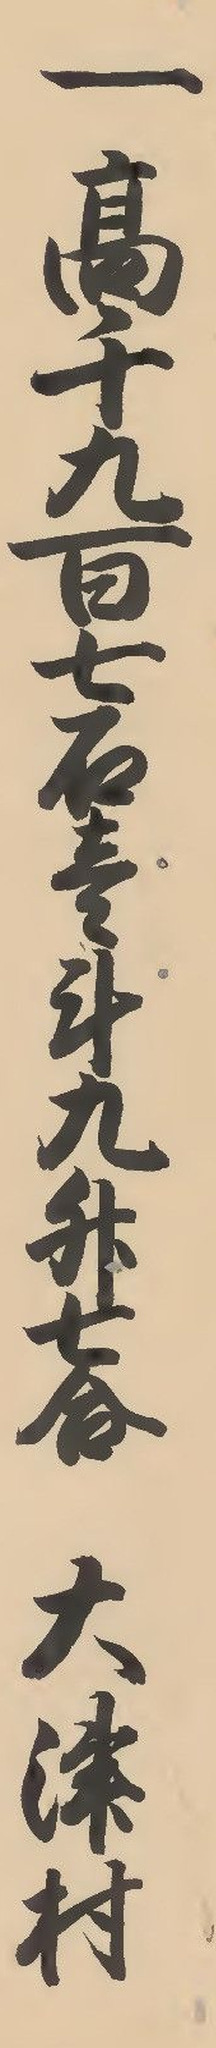一高千九百七石壱斗九升七合大津村
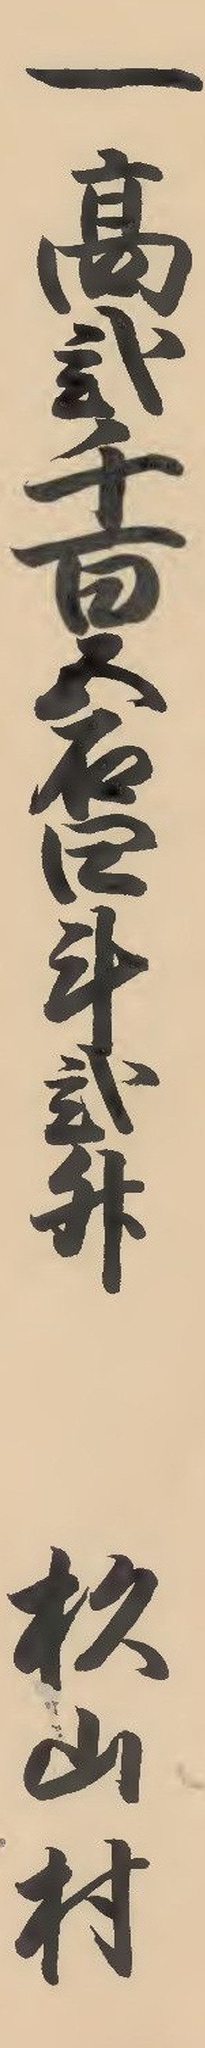一高弐千百五石四斗弐升杉山村
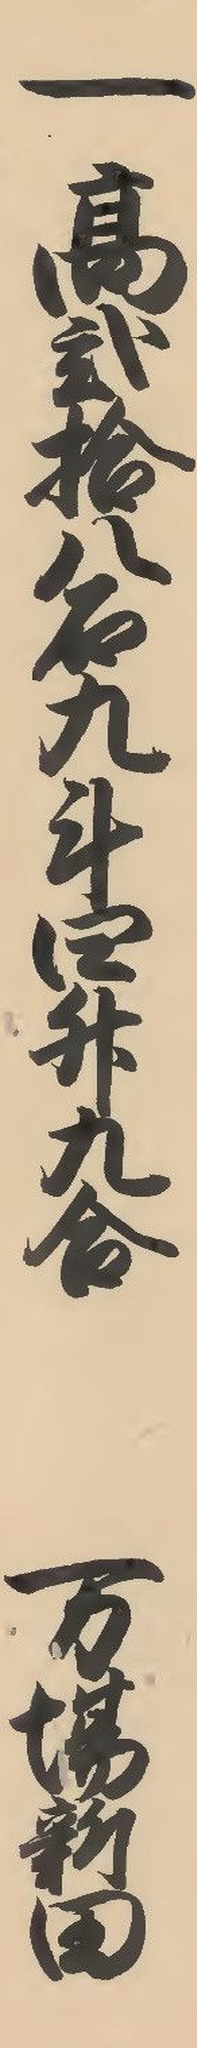一高弐拾八石九斗四升九合万場新田
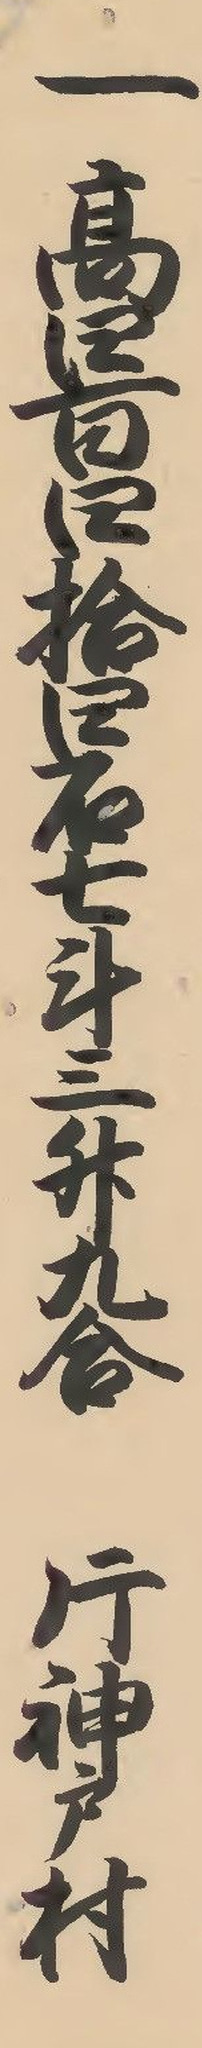一高四百四拾四石七斗三升九合片神戸村
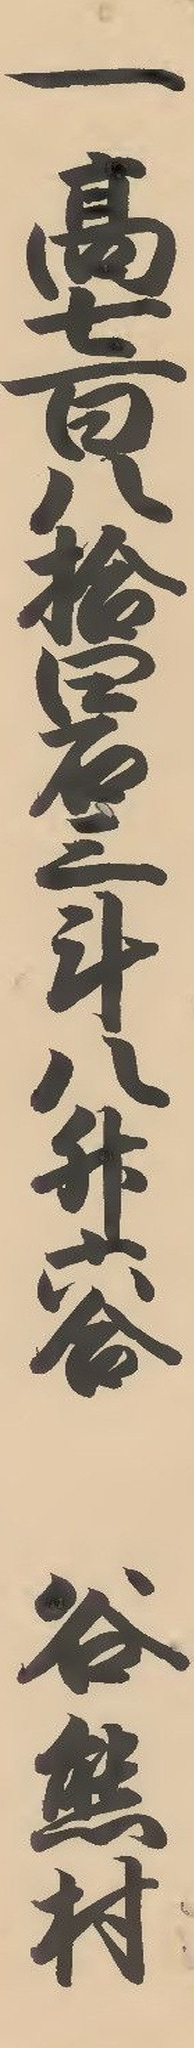一高七百八拾四石三斗八升六合谷熊村
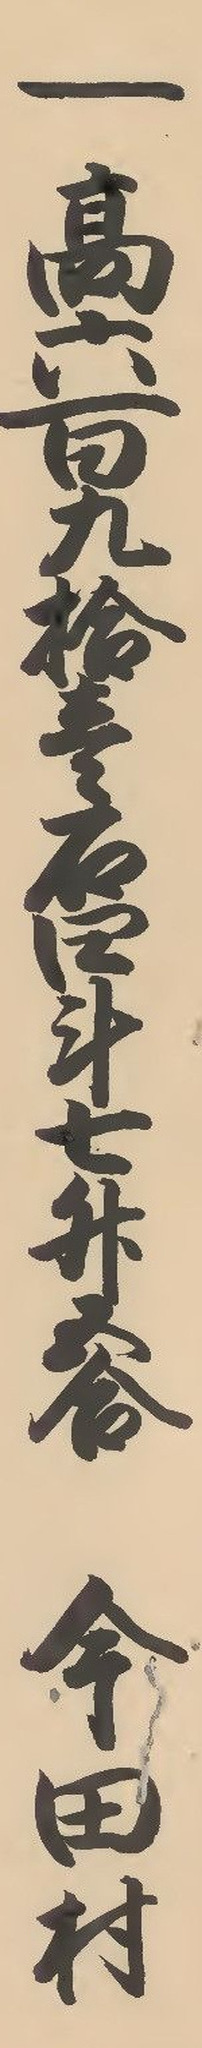一高六百九拾壱石四斗七升五合今田村
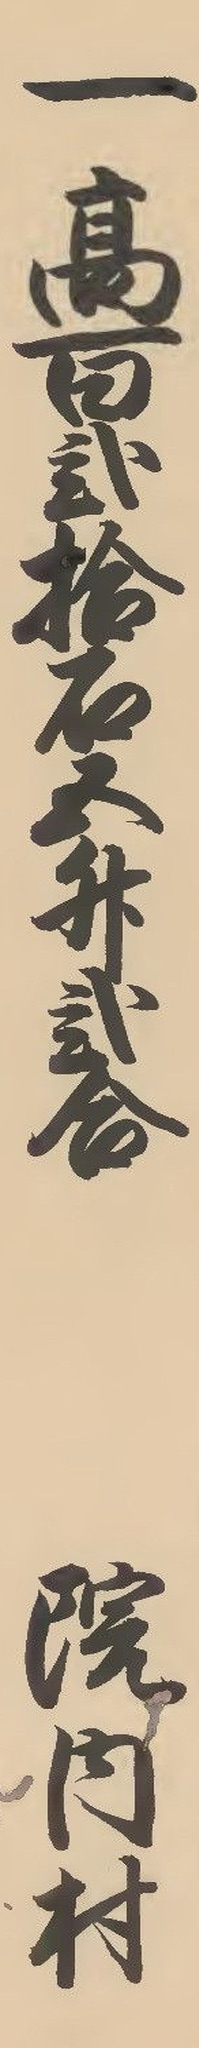一高百弐拾石五升弐合院内村
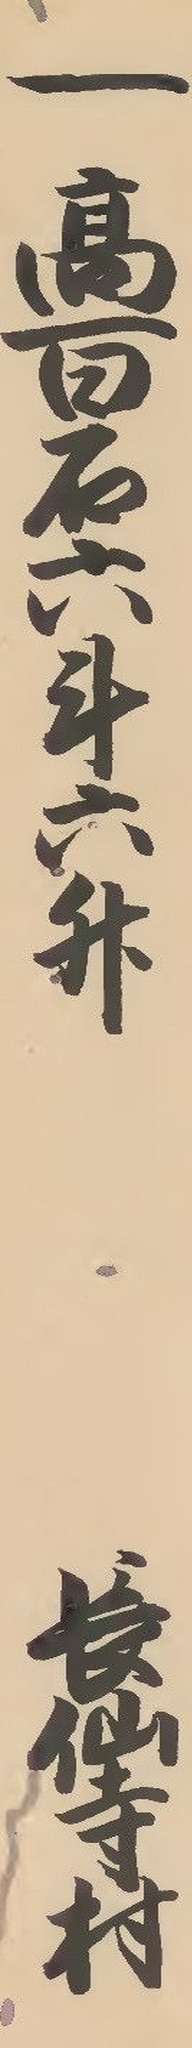一高百石六斗六升長仙寺村

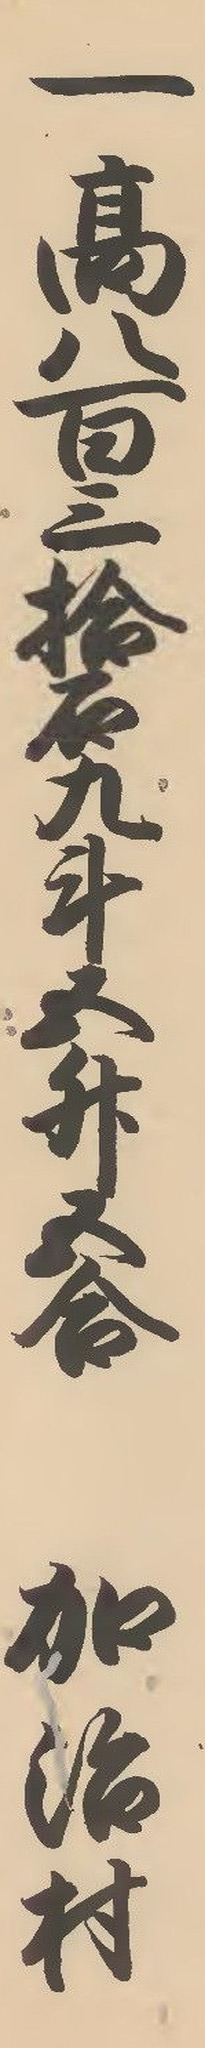一高八百三拾石九斗五升五合加治村
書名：三河国郷帳
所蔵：国立公文書館 National Archives of Japan
